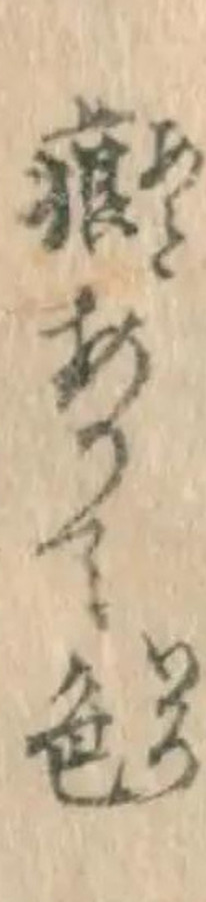痕ありて色
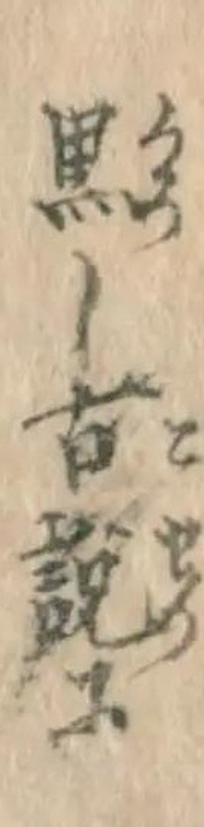黒し古説に
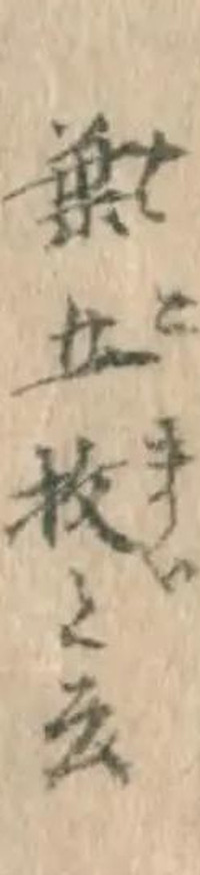葉五枚と云
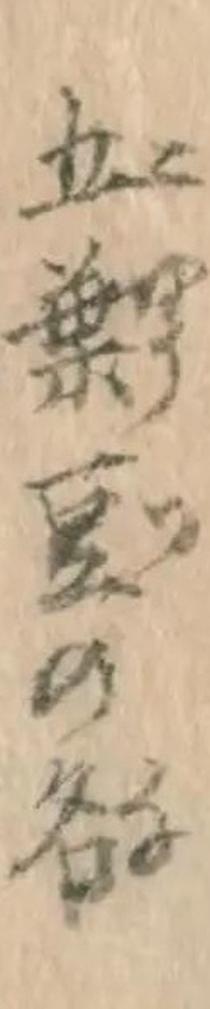五葉豆の名
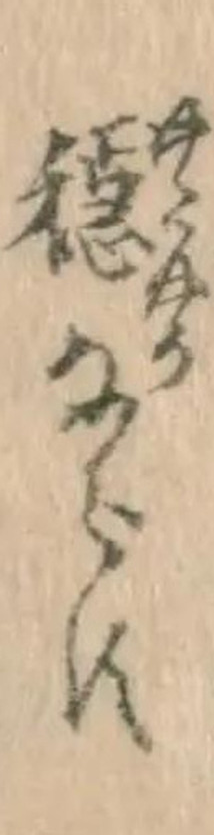穏ならす

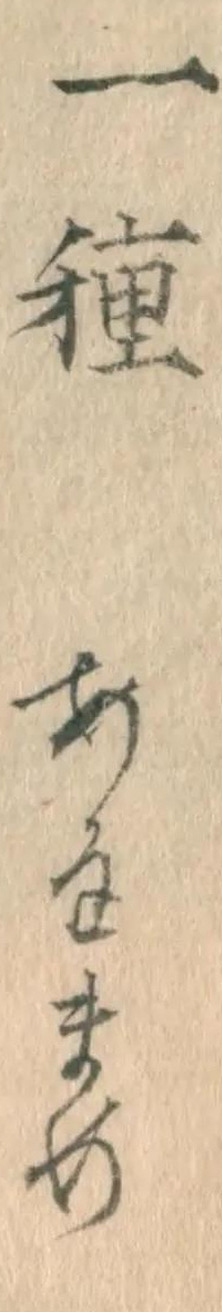一種あをまめ
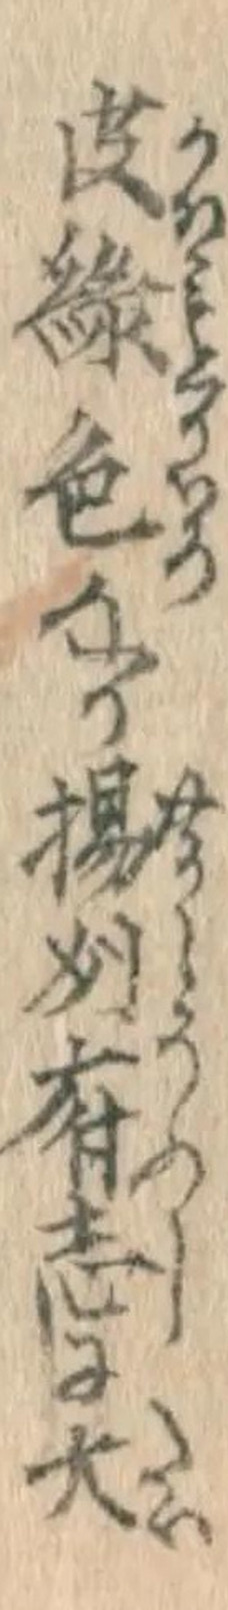皮緑色なり揚州府志に大
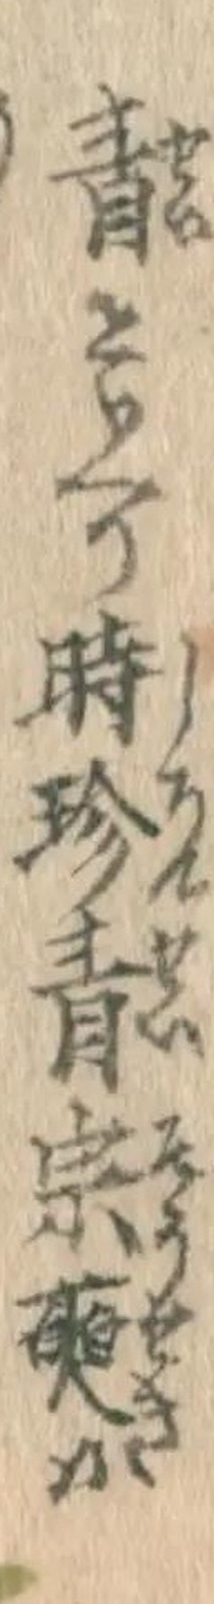青といへり時珍青宗奭は
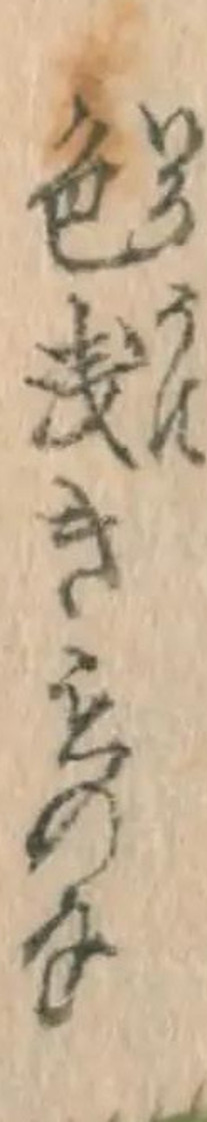色浅きものを
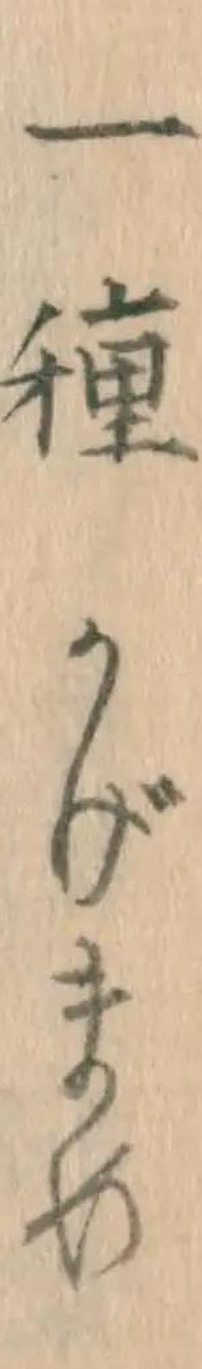一種かげまめ
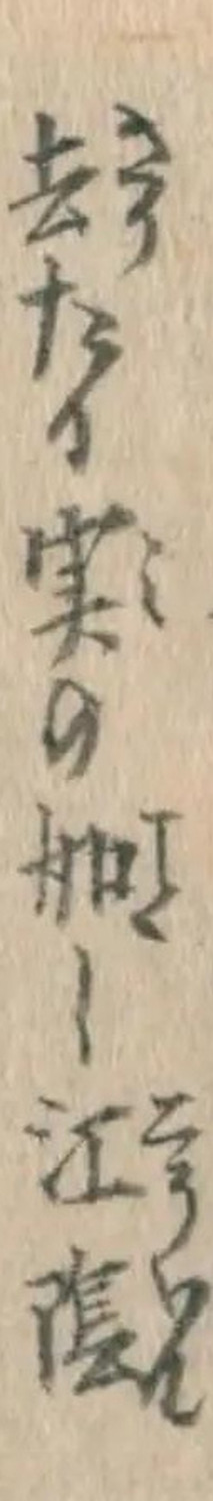去たる実の如し江陰
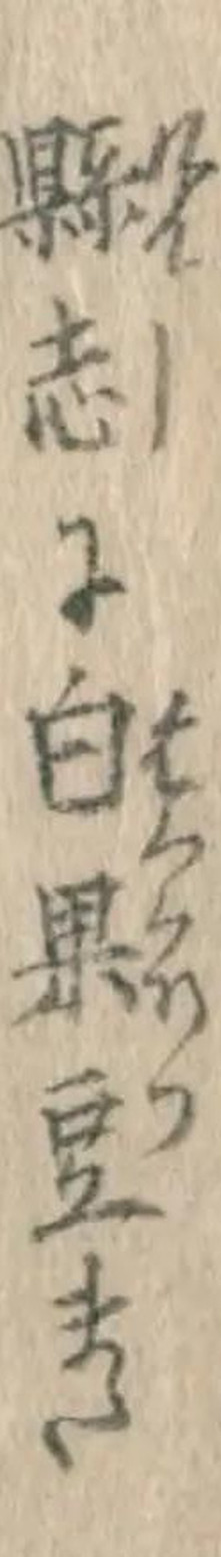県志に白果豆また
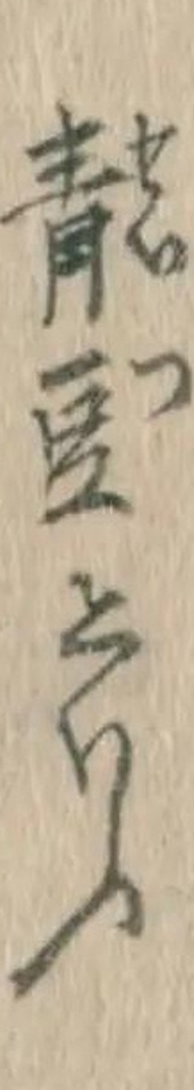青豆といふ

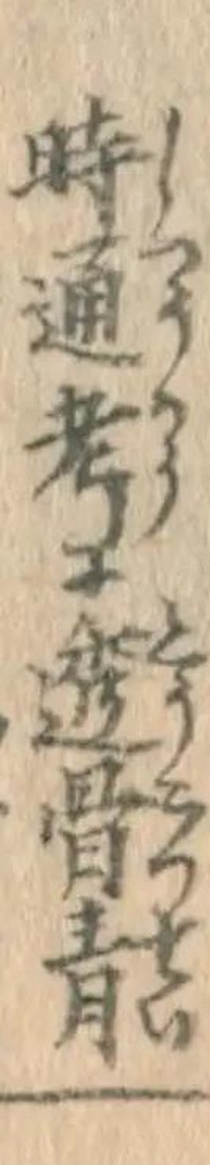時通考に透骨青
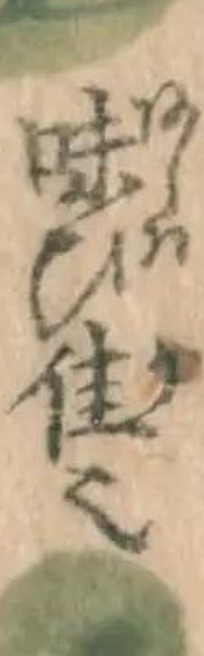味ひ佳也
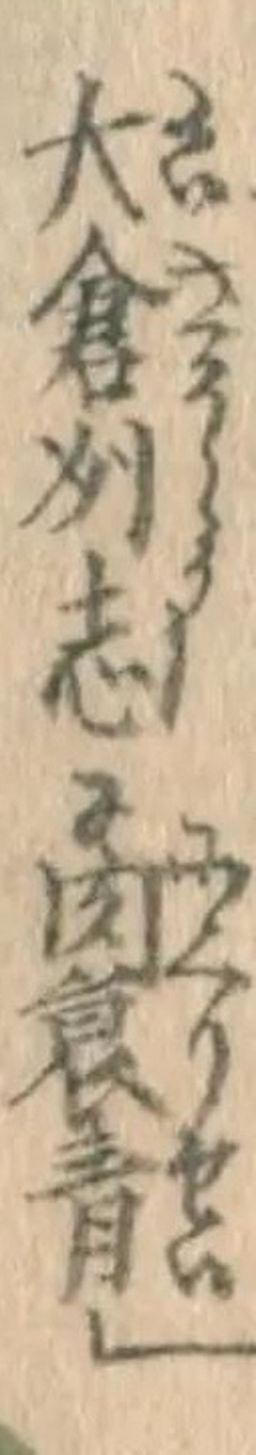大倉州志に肉裏青
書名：本草図譜. 巻43-45
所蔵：国立国会図書館 National Diet Library, JAPAN
